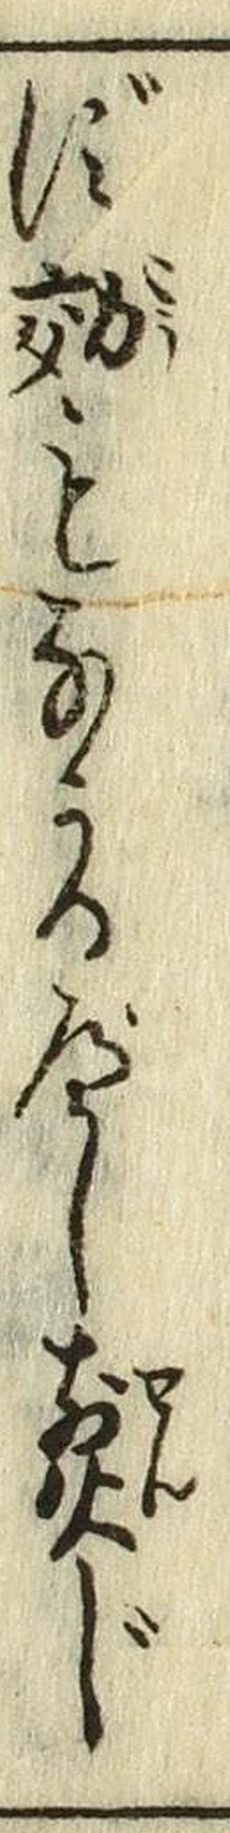ず効もなかるべし煎じ
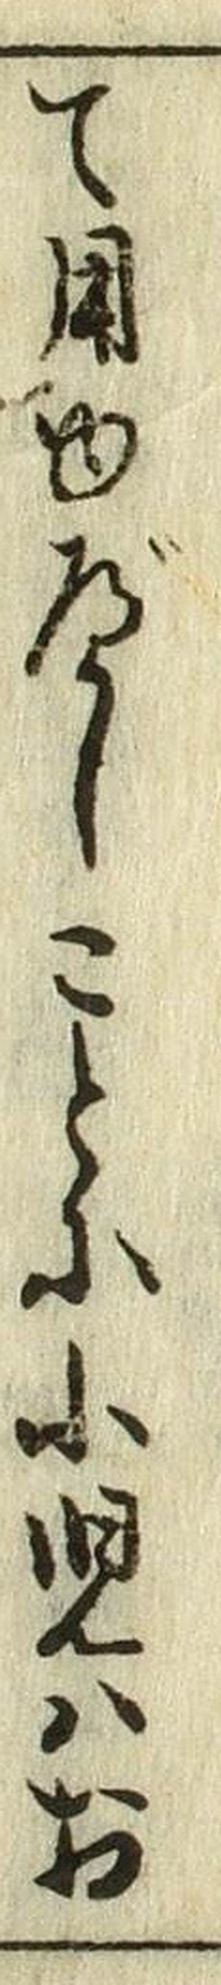て用ゆべしことに小児はお
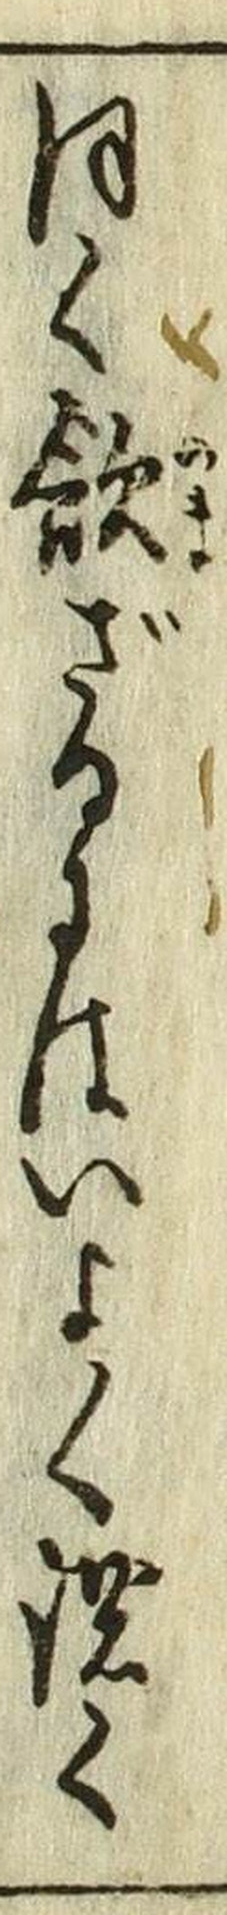ほく飲ざるにはいよ〳〵濃く
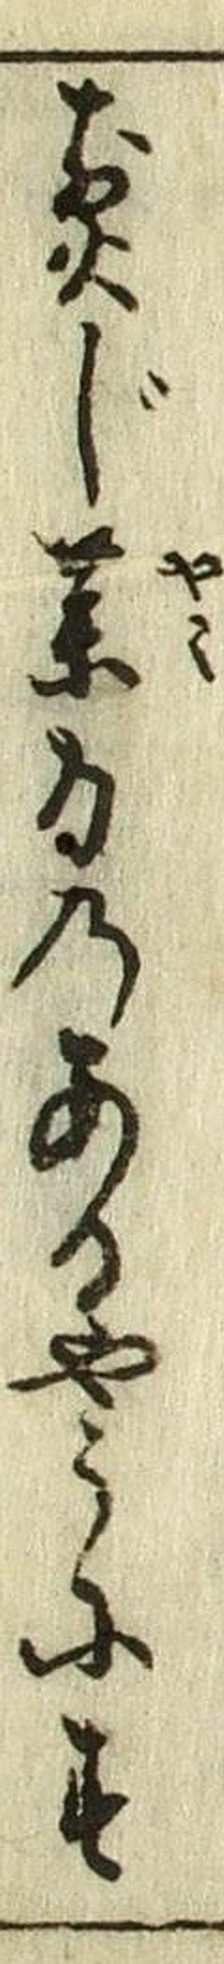煎じ薬力のあるやうにす

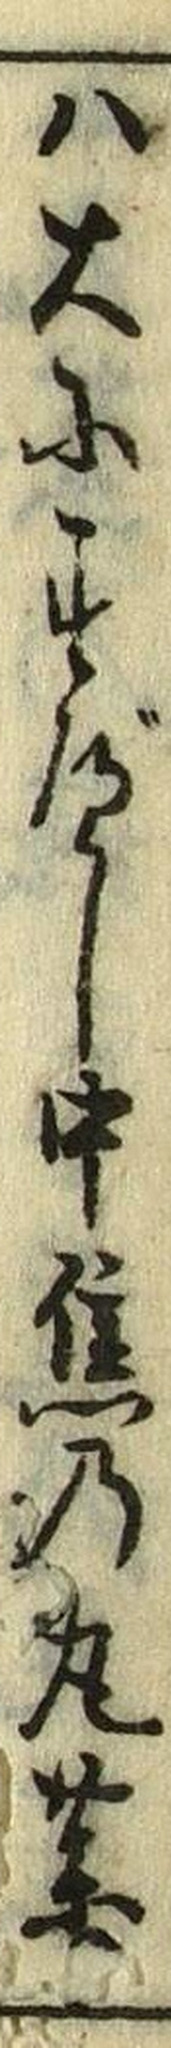は大にすべし中焦の丸薬
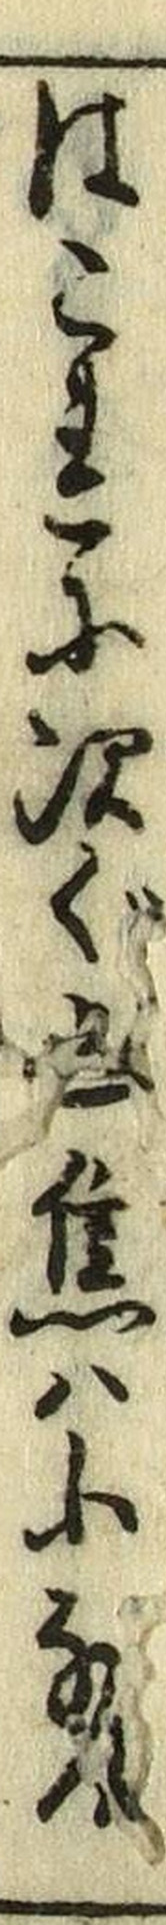はこれに次ぐ上焦は小なる
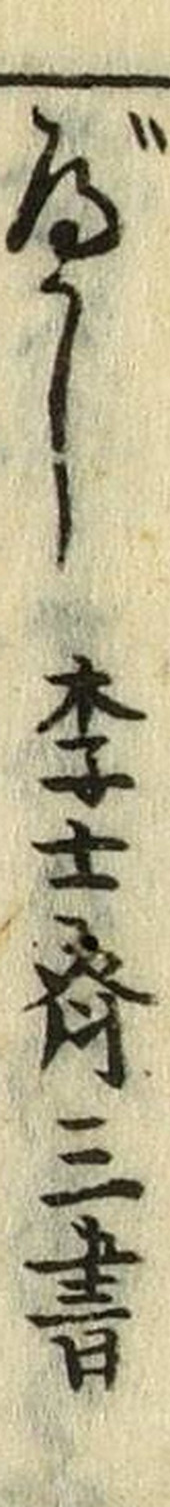べし李士斎三書
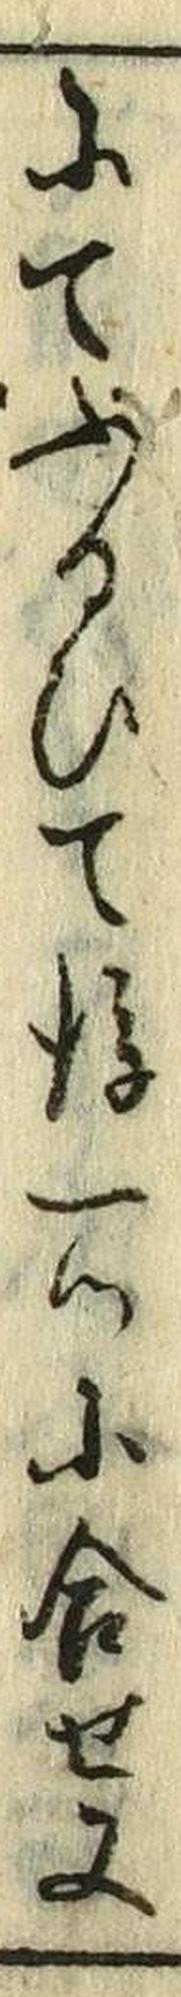にてふるひて後一ツに合せ又
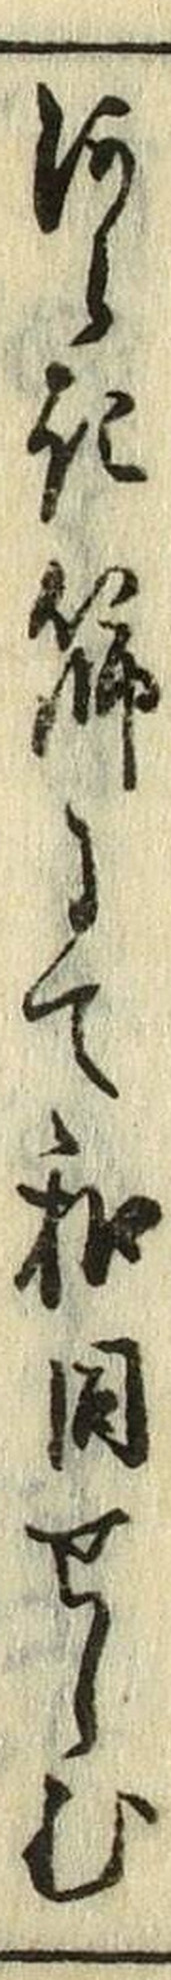あらき篩にて和同せしむ
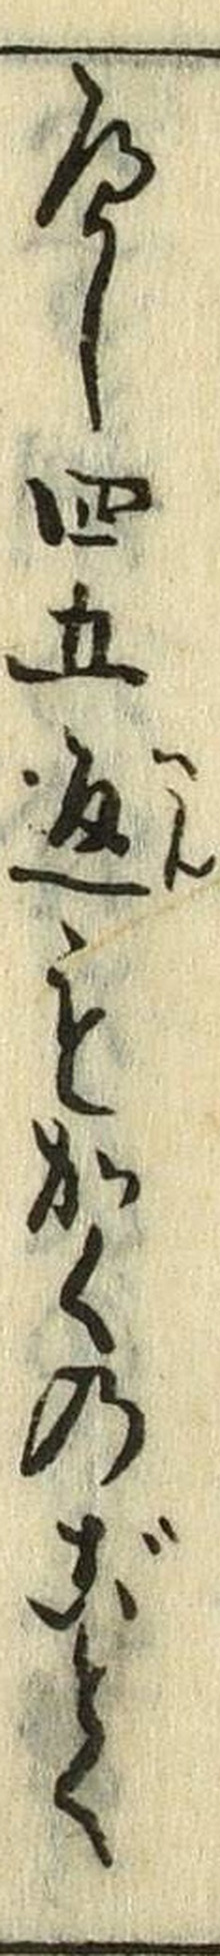へし四五返もかくのごとく
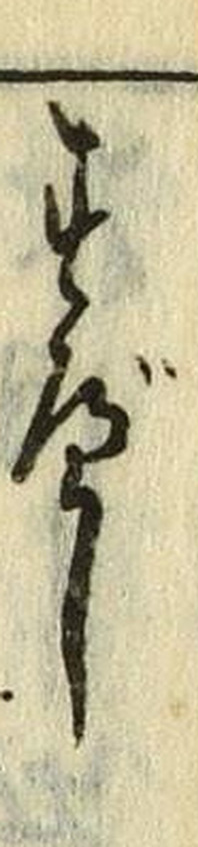すべし
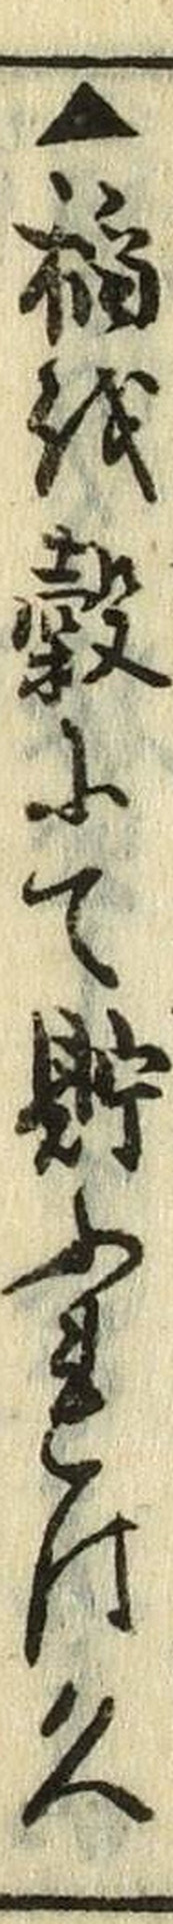▲稲を穀にて貯ふれは久
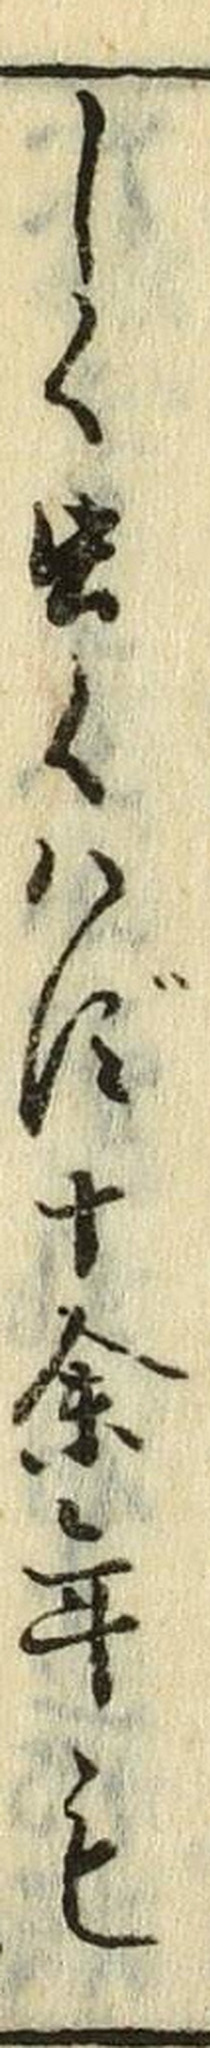しく虫くはず十余年も
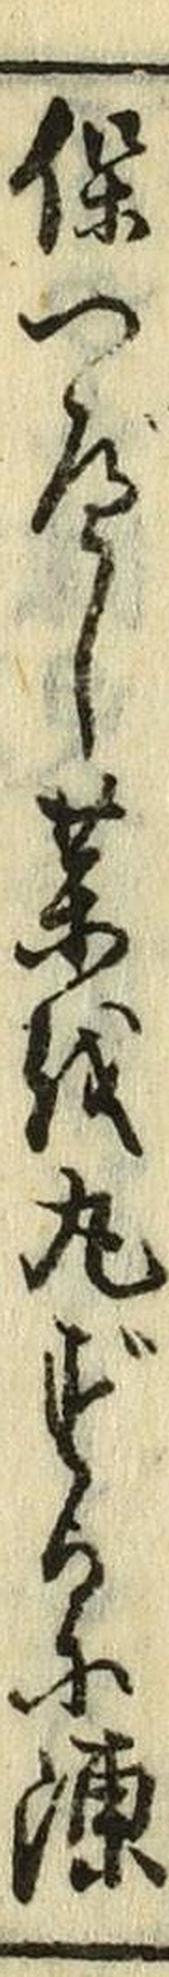保つべし薬を丸ずるに陳
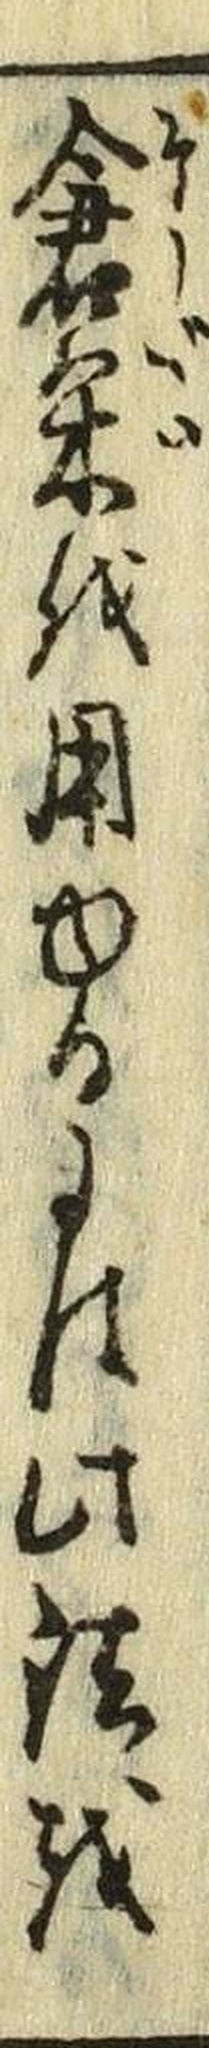倉米を用ゆるには此法を
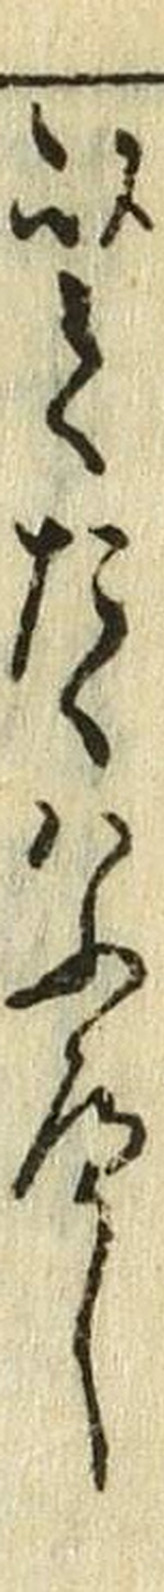以てたくはふべし
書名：居家養生記
